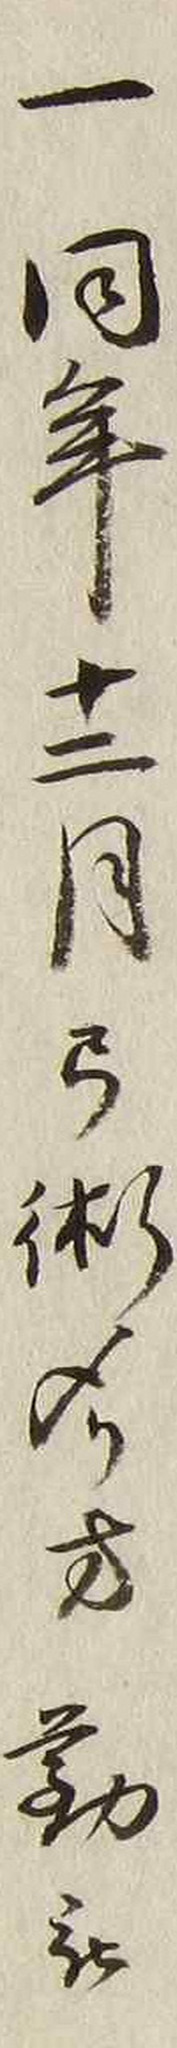一同年十二月弓術〆ㇼ方勤被

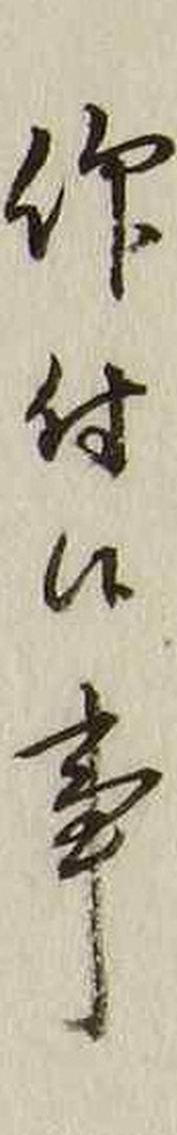仰付候事
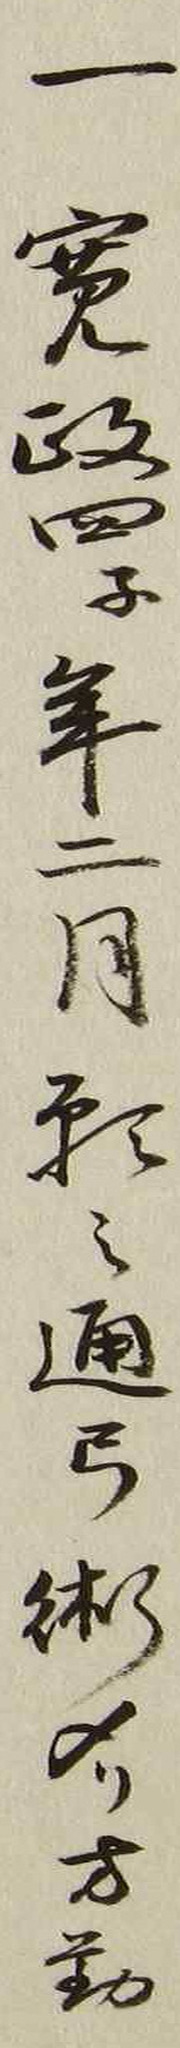一寛政四子年二月願之通弓術〆ㇼ方勤
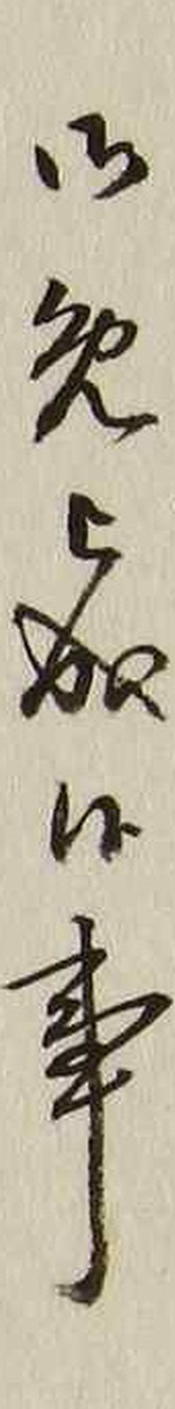御免被成候事
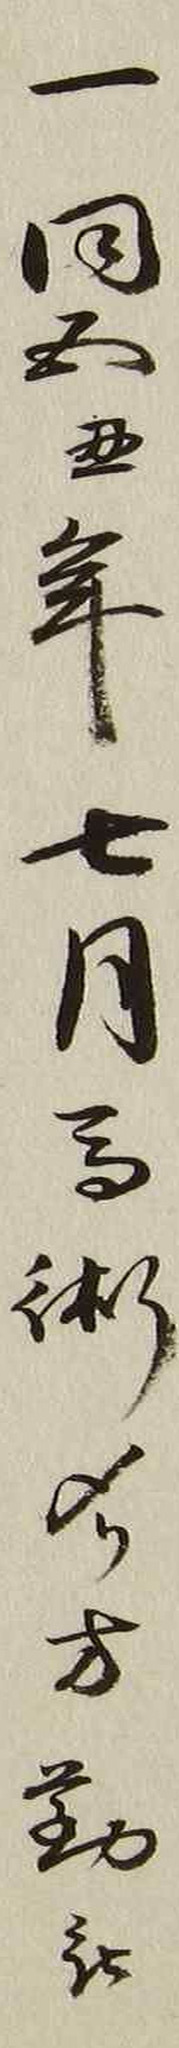一同五丑年七月馬術〆ㇼ方勤被
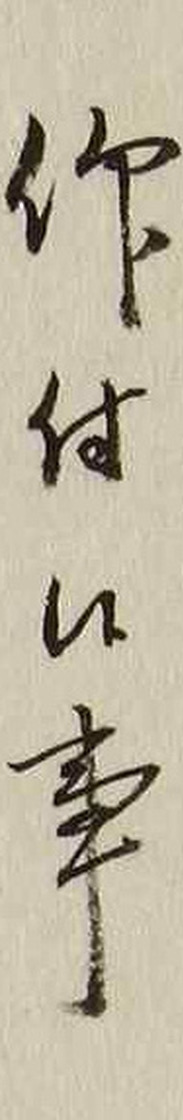仰付候事
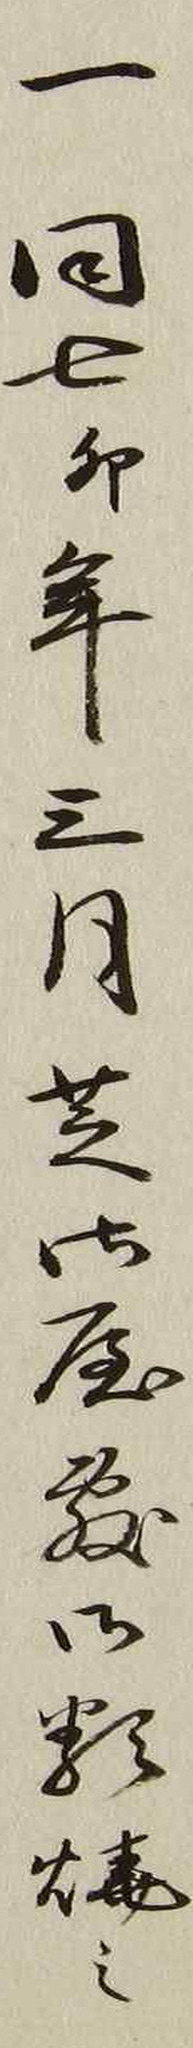一同七卯年三月芝御屋敷御類焼之
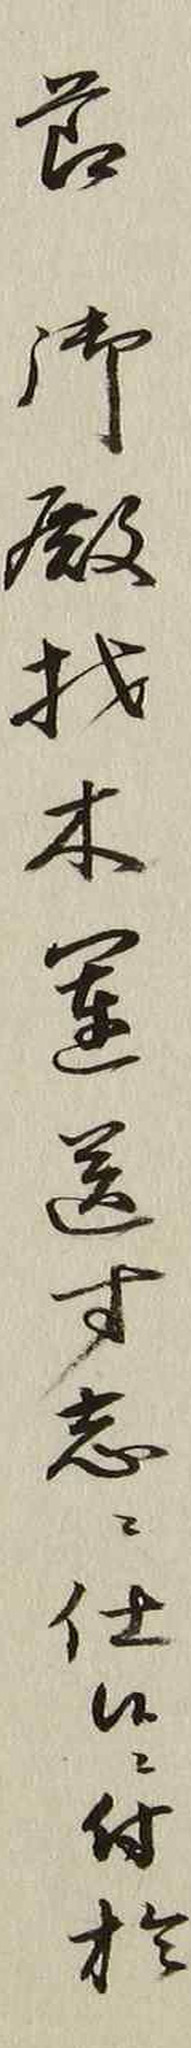節御殿材木運送寸志ニ仕候ニ付於
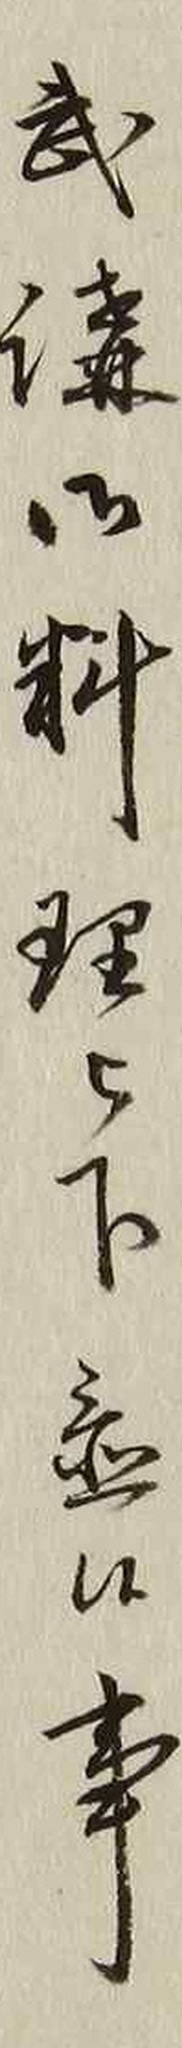武講御料理被下置候事
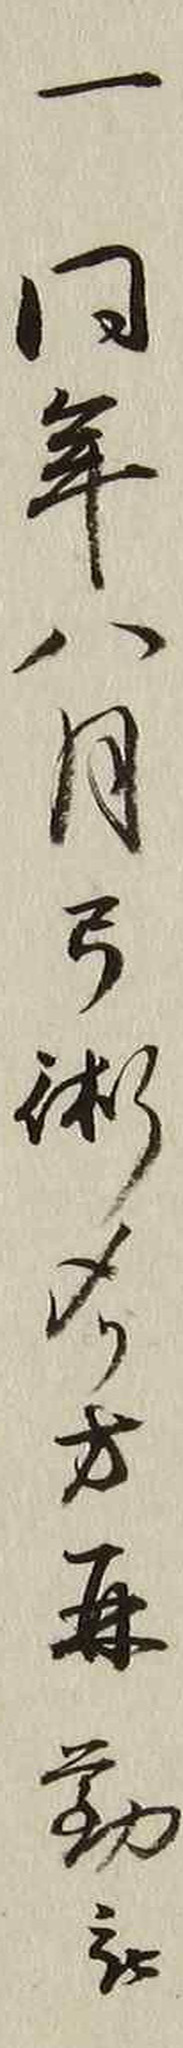一同年八月弓術〆ㇼ方再勤被
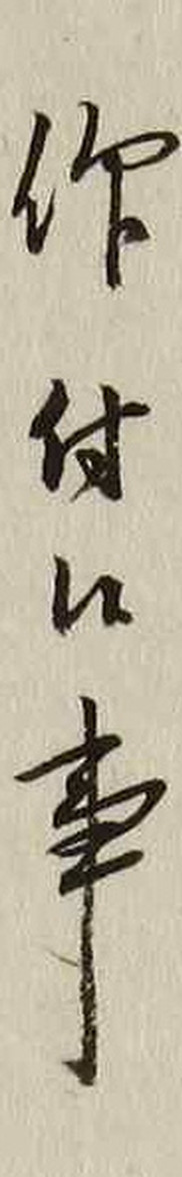仰付候事
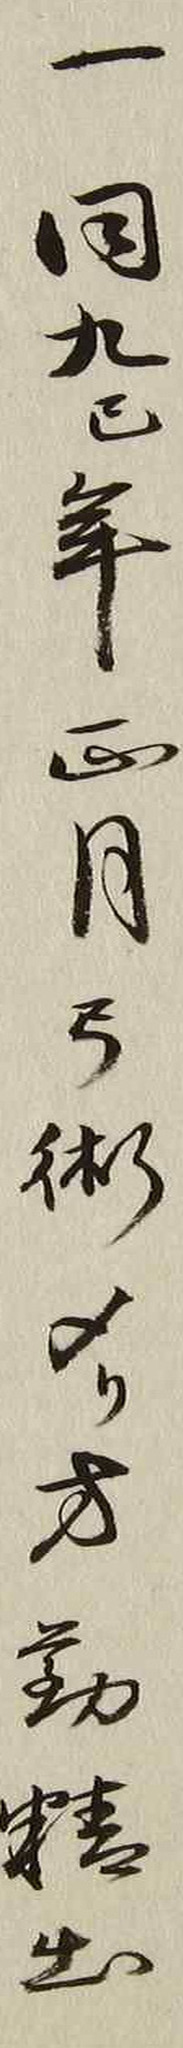一同九巳年正月弓術〆ㇼ方勤精出
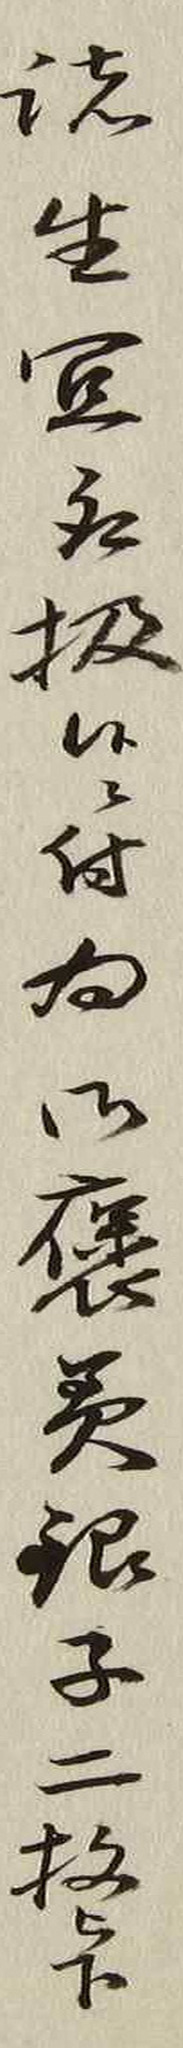諸生宜取扱候ニ付為御褒美銀子二枚被下
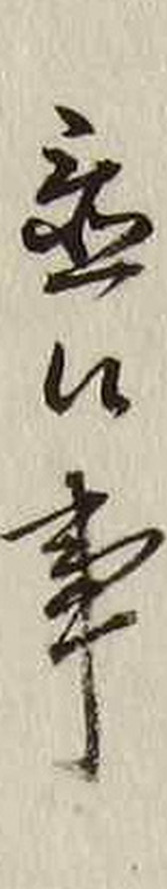置候事
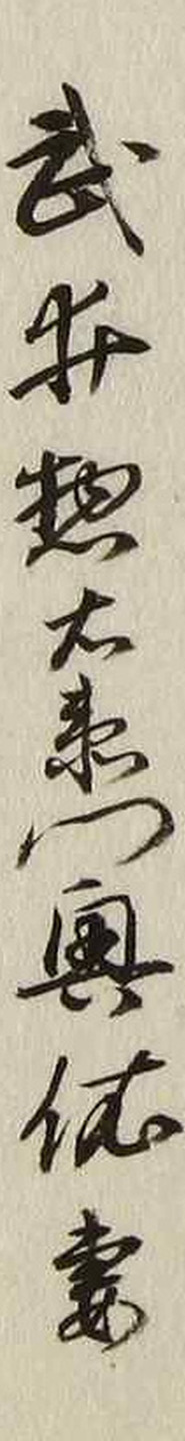武井惣右衛門興依妻
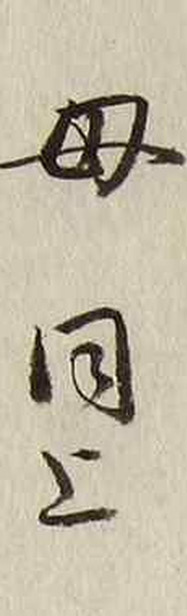母同上
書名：諸士系譜　巻之160　な之部2
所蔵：会津若松市立会津図書館
